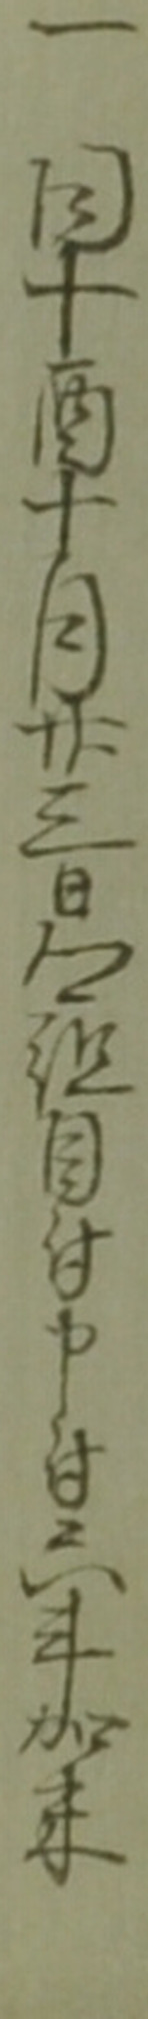一同十酉十月廿三日郷組目付申付六斗加米
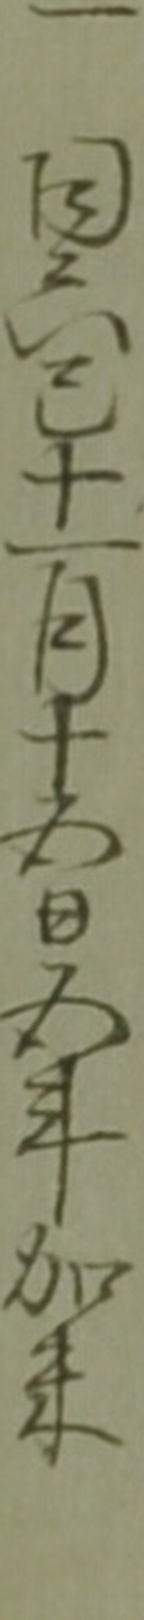一同六巳十一月十五日五斗加米
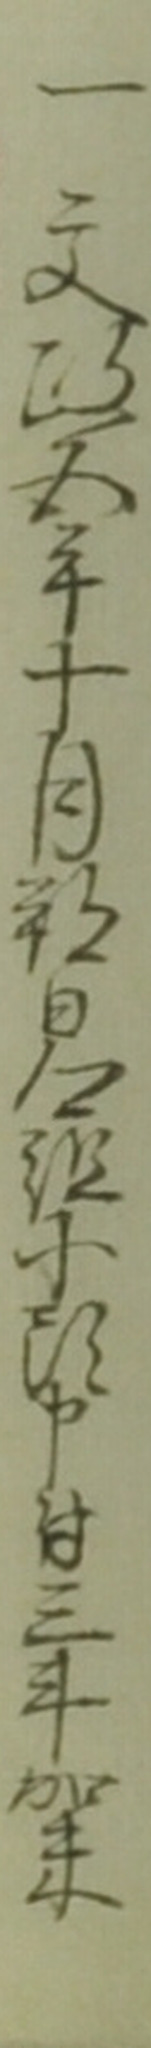一文政五午十月朔日郷組小頭申付三斗加米

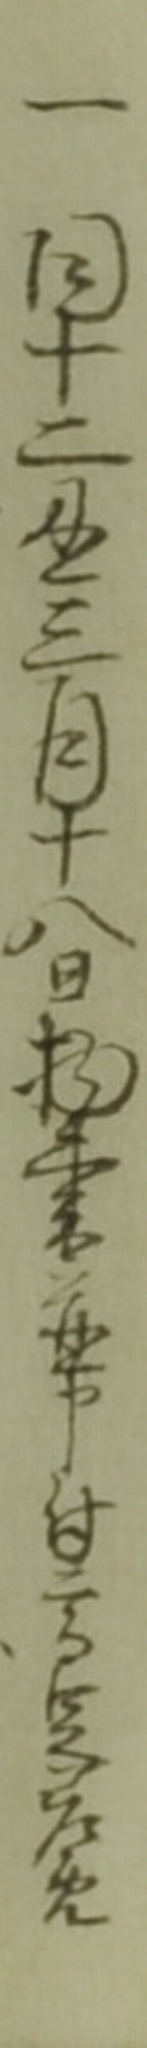一同十二丑三月十八日物書並申付高定差免
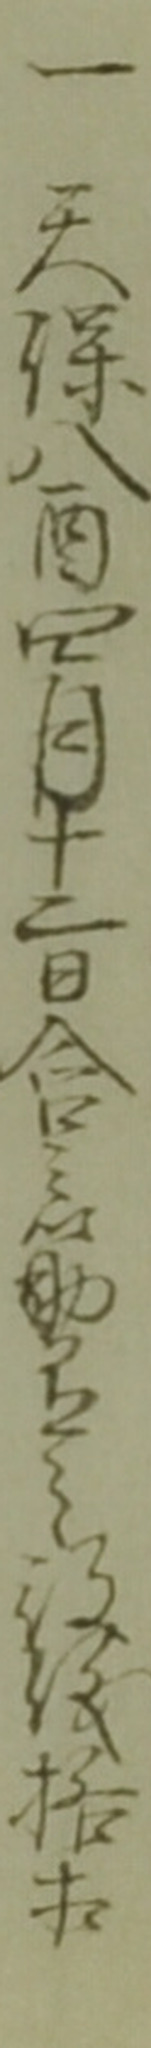一天保八酉四月十二日含之筋有之役儀格相
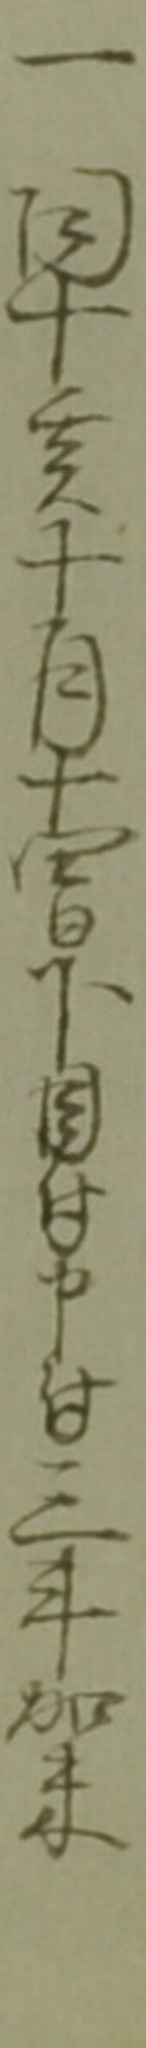一同十亥十月十四日下目付申付三斗加米
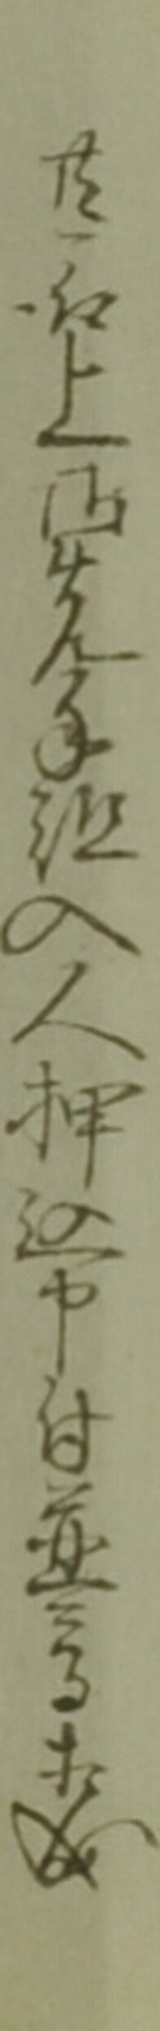共取上御先手組入人押込申付並高相成
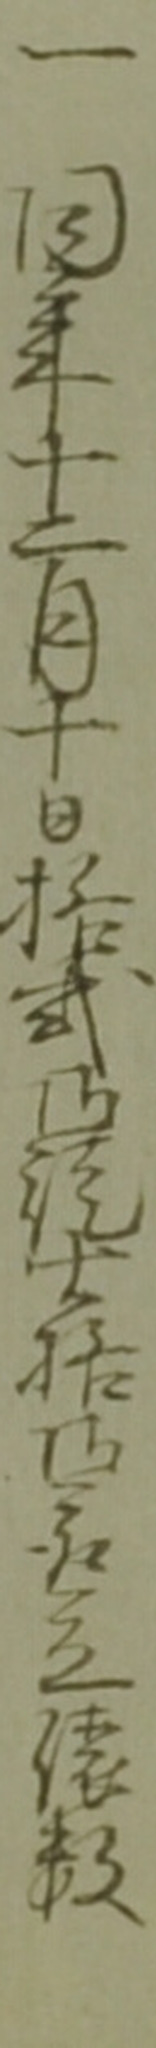一同年十二月十日格式御徒士格御取立俵数
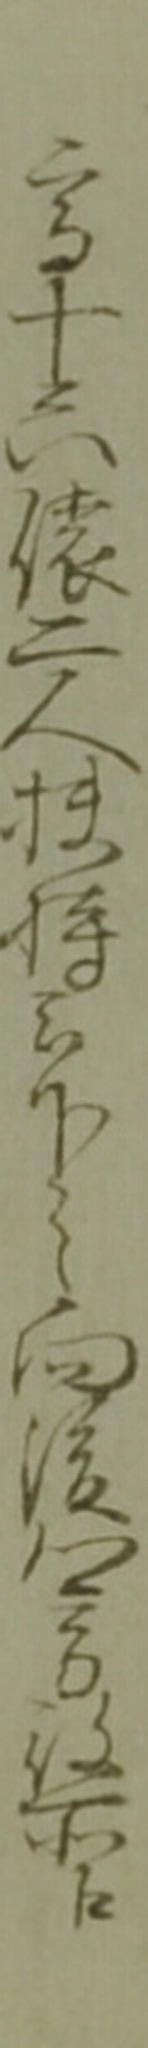高十六俵二人扶持被下之向後郷方役所江
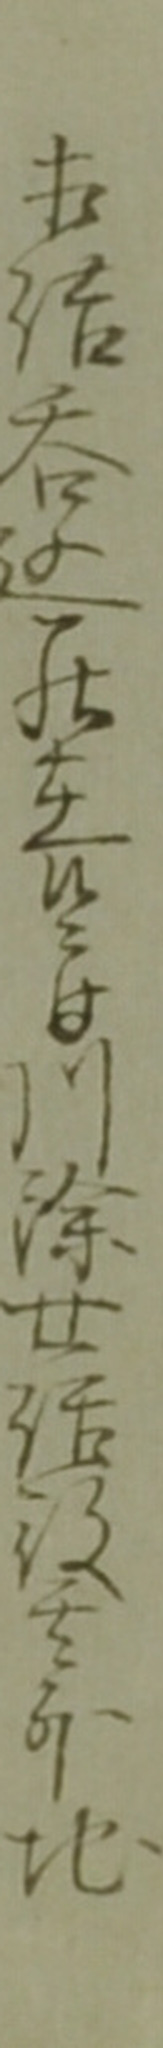相詰呑込罷在候ニ付川添世話役其外地
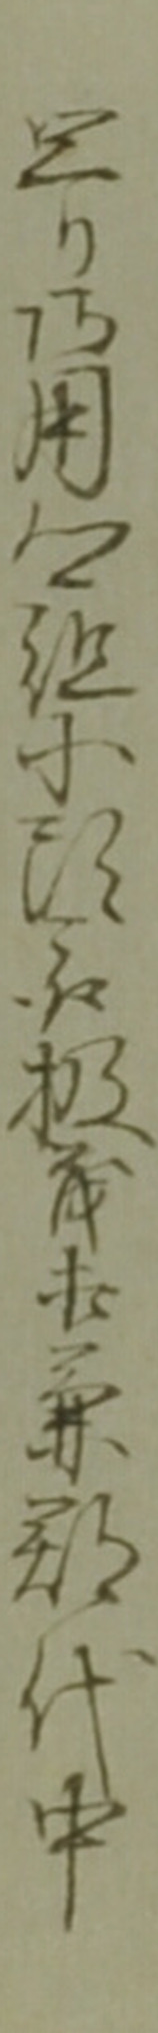廻り御用郷組小頭取扱茂相兼郡代中
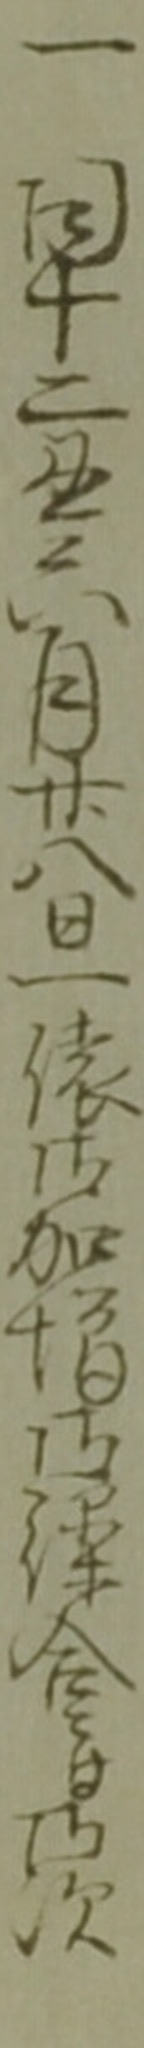一同十二丑六月廿八日一俵御加増御繰合ニ付御次
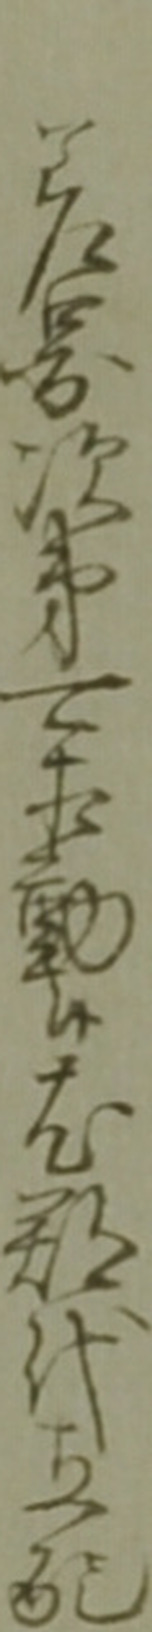差図次第可相勤候尤郡代支配
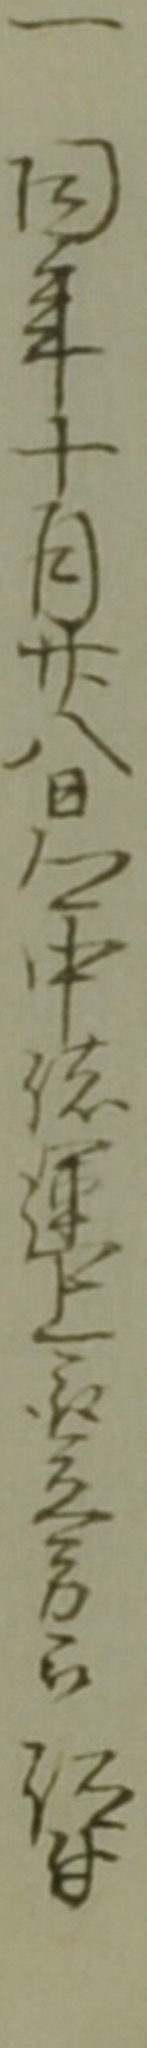一同年十月廿八日郷中諸運上取立方被仰付
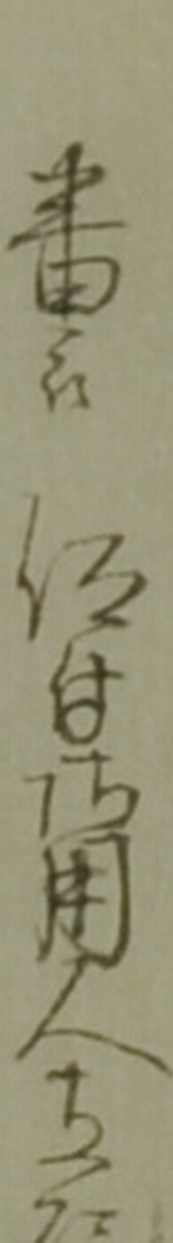番被仰付御用人支配
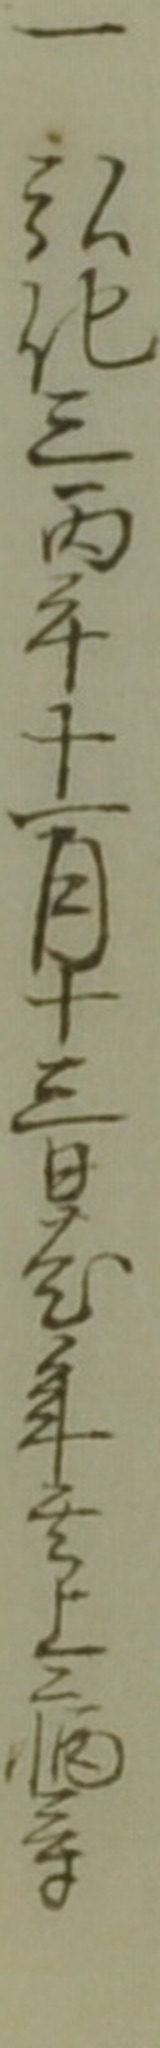一弘化三丙午十一月十三日老年其上病気
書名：無足諸士勤仕録（九）
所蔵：伊那市立高遠町図書館・合同会社AMANE
